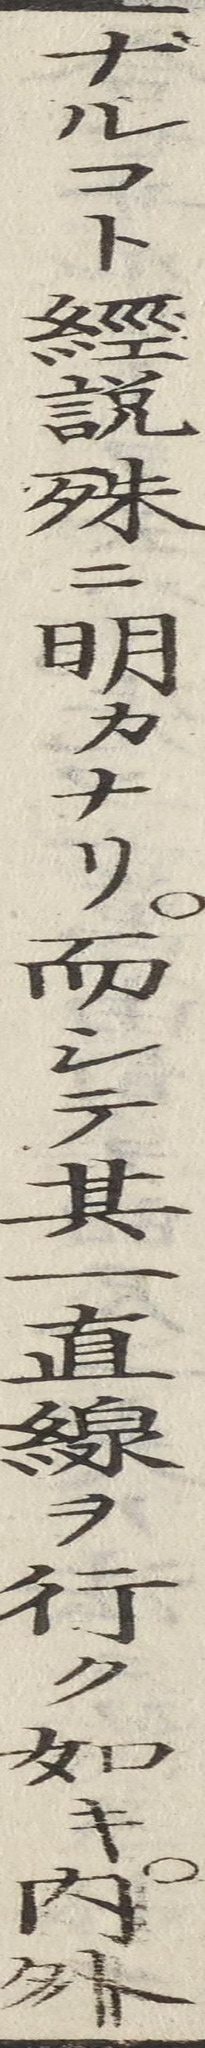ナルコト経説殊ニ明カナリ。而シテ其一直線ヲ行ク如キ。内外
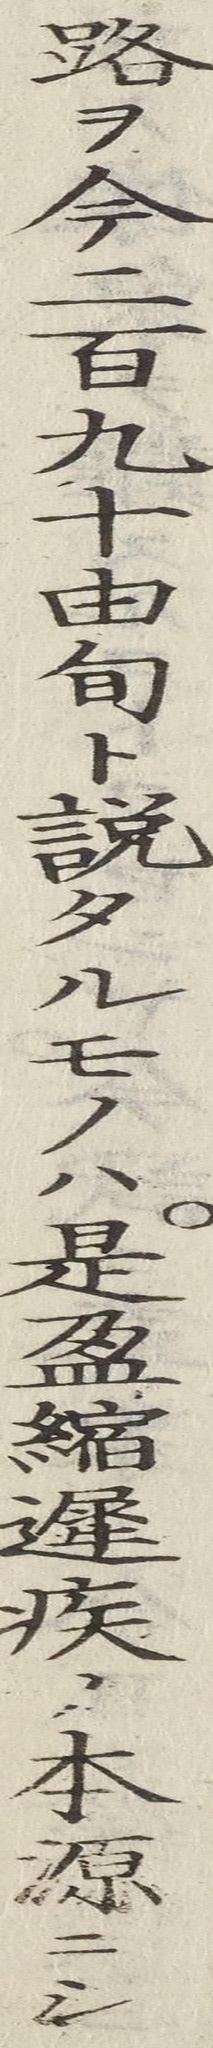路ヲ今二百九十由旬ト説タルモノハ。是盈縮遅疾ノ本源ニシ
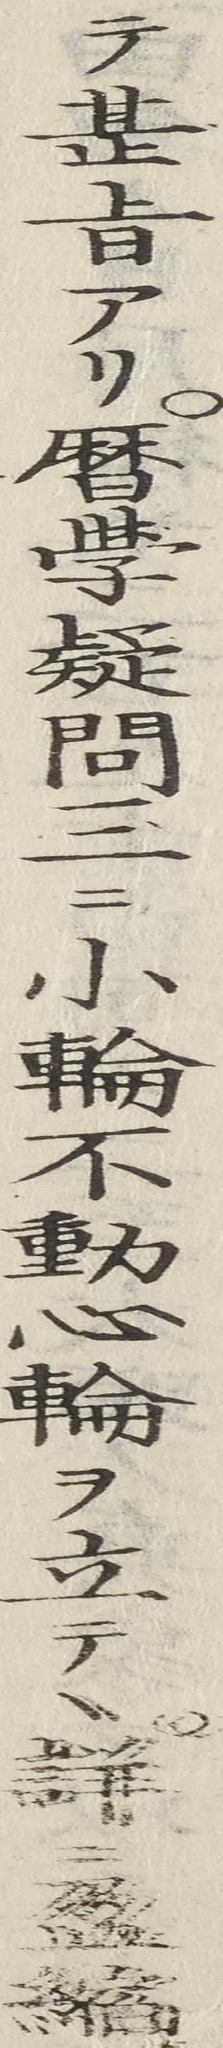テ甚旨アリ。暦学疑問三ニ小輪不動心輪ヲ立テヽ。詳ニ盈縮
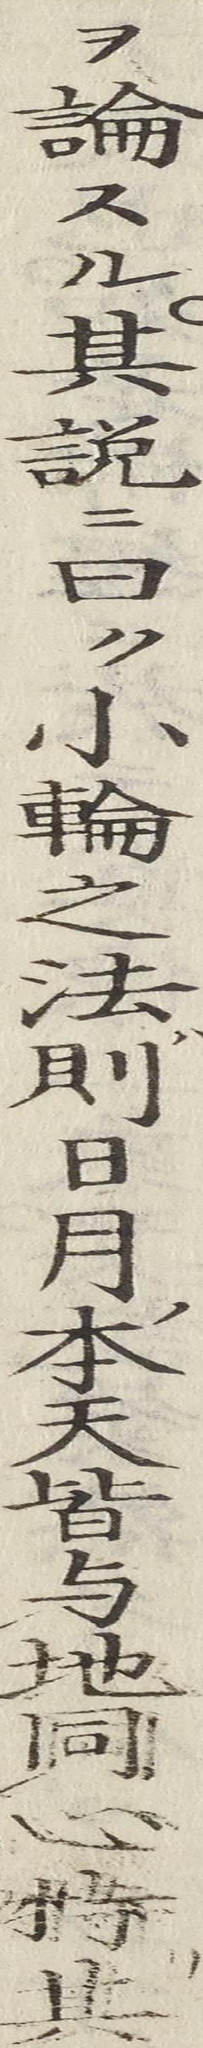ヲ論スル。其説ニ曰ク小輪之法則日月本天皆与地同心持其
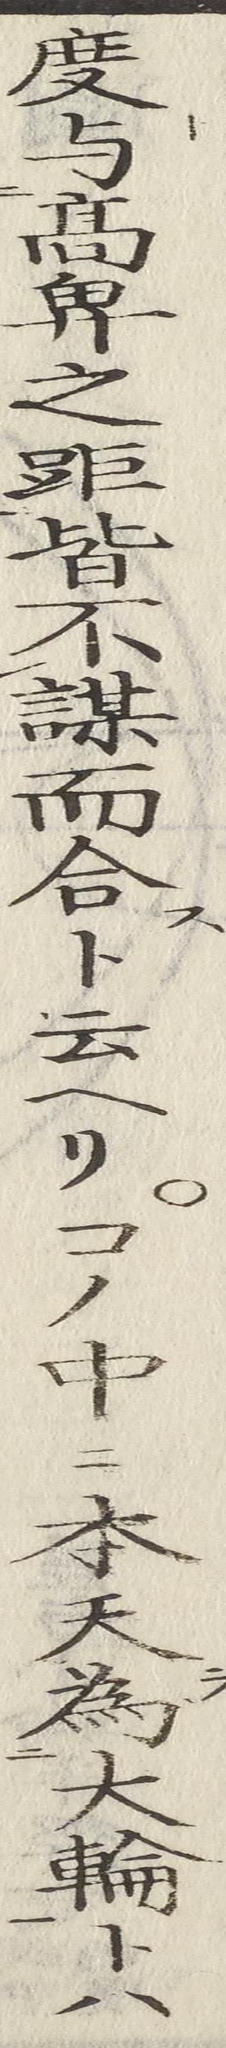度与ニ高卑之距皆不謀而合云ヘリ。コノ中ニ本天為ニ大輪トハ
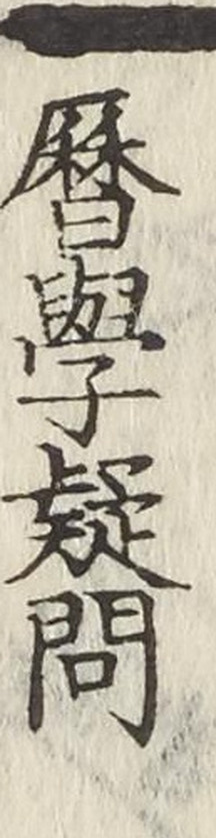暦学疑問
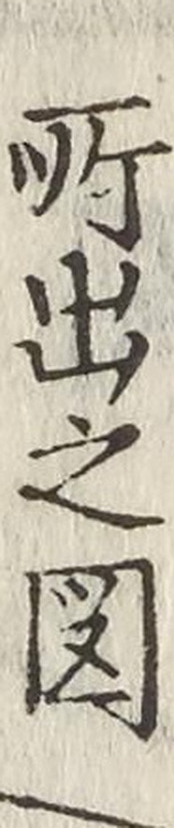所出之図
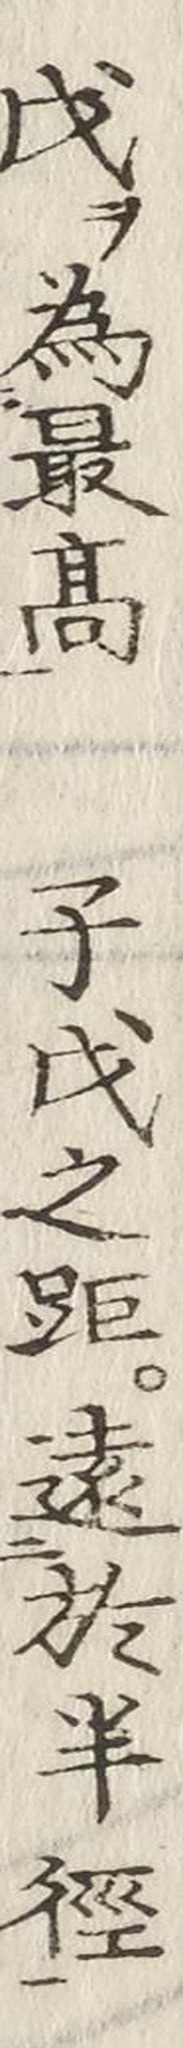戊為ニ最高子戊之距。遠ニ於半径
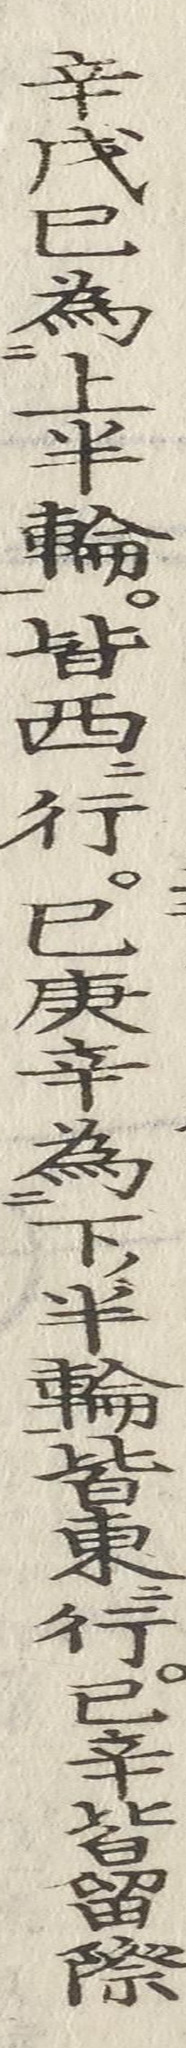辛戊己為ニ上半輪。皆西行。己庚辛為ニ下半輪皆東行。己辛皆留際
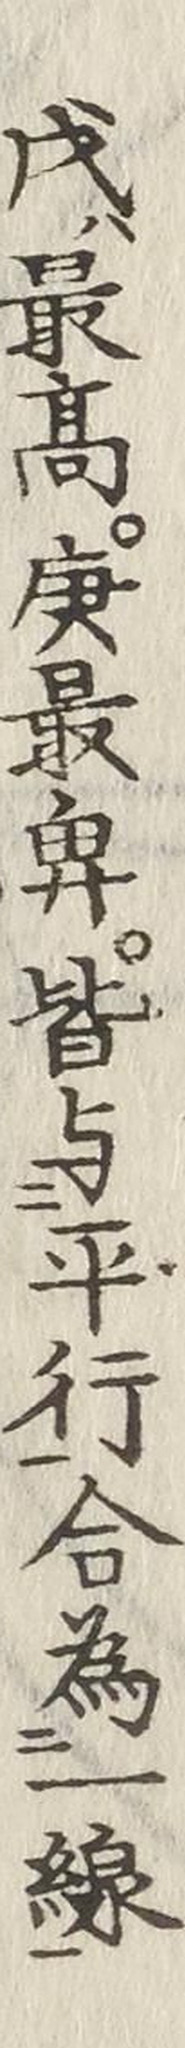戊最高。庚最卑。皆与ニ平行合為ニ一線
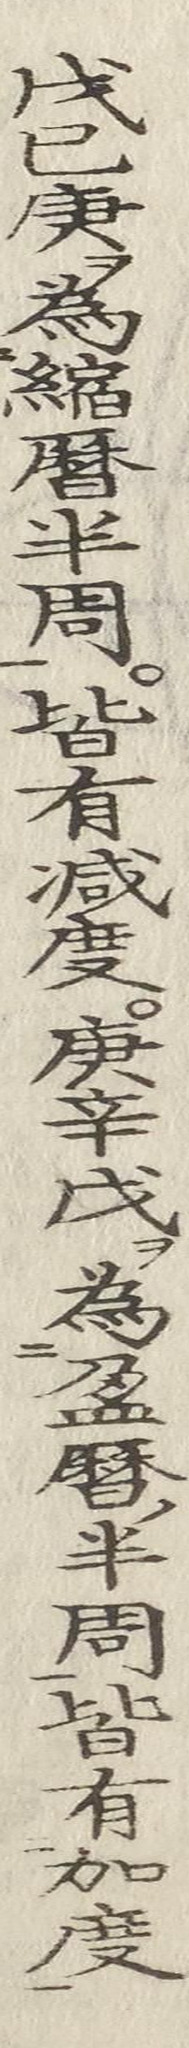戊己庚為ニ縮暦半周。皆有減度。庚辛戊為ニ盈暦半周皆有ニ加度

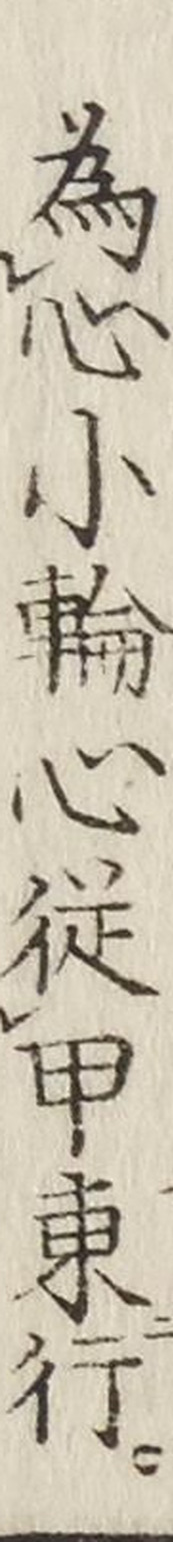為心小輪心従甲東行。
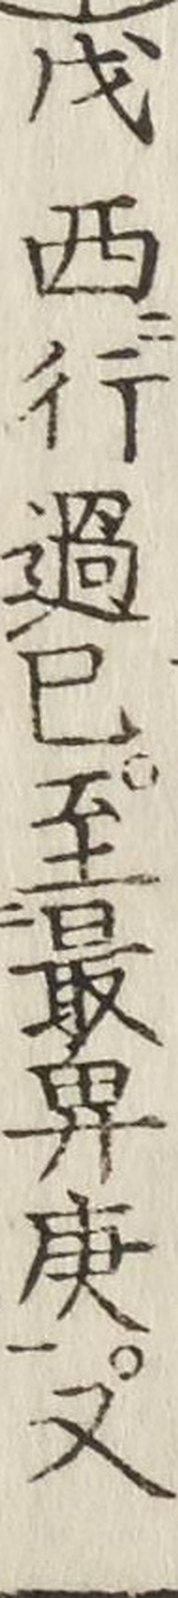西行過己。至ニ最卑庚。又
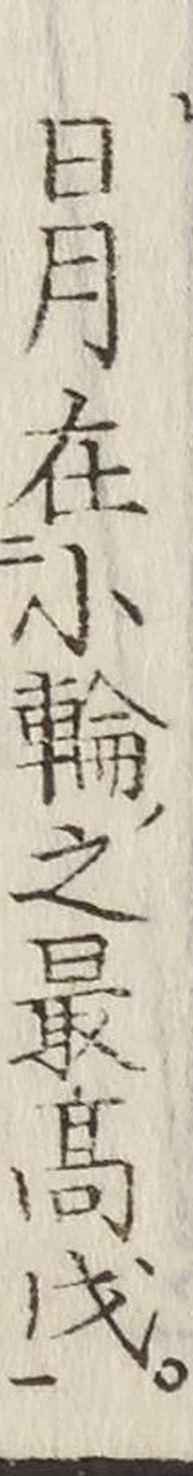日月在ニ小輪之最高戊。
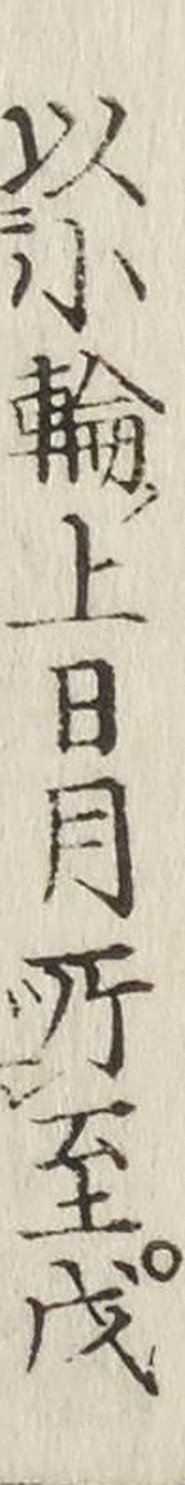以ニ小輪上日月所レ至。戊
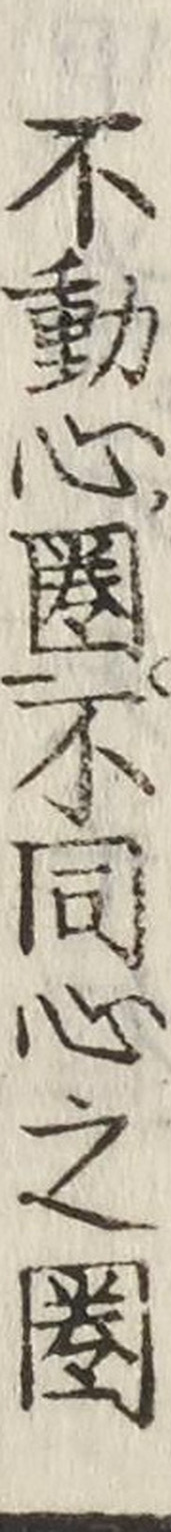不動心圏。不同心之圏
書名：護法新論　二編　上
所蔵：東京大学地震研究所図書室 Earthquake Research Institute Library, The University of Tokyo, JAPAN
